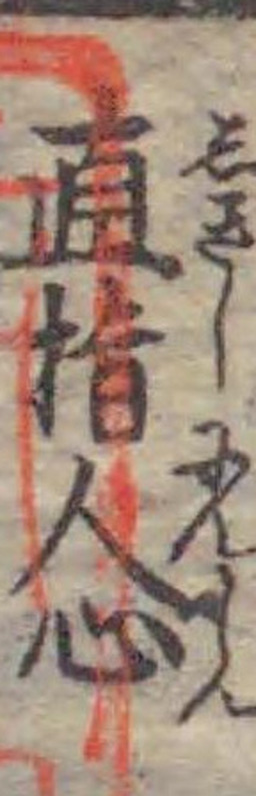直指人心
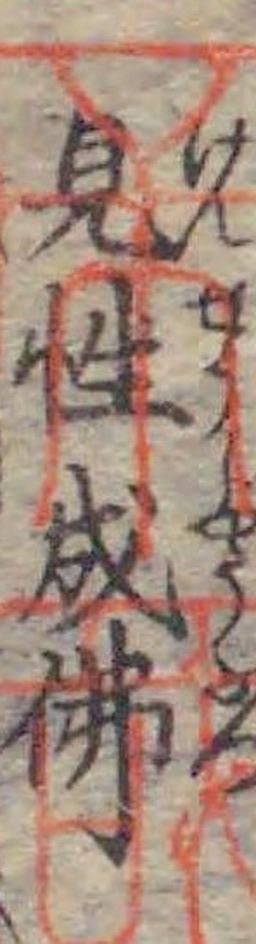見性成仏

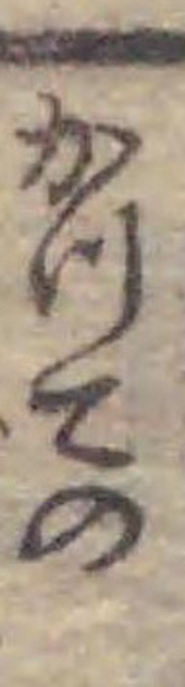かつての
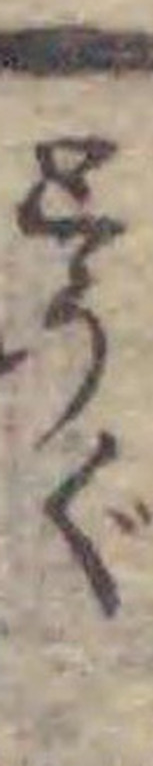とうぐ
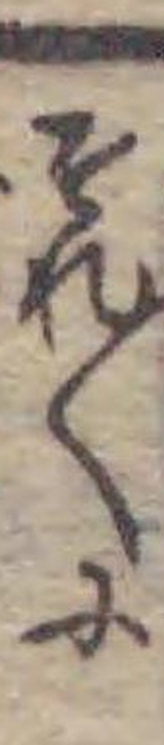それ〳〵に
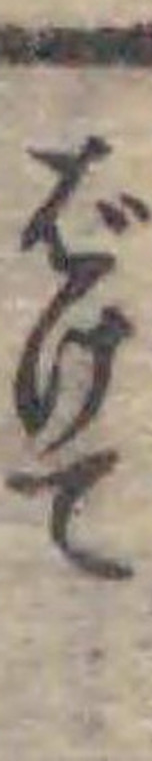ばけて
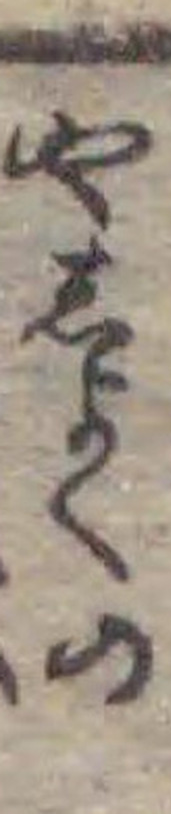やしよくの
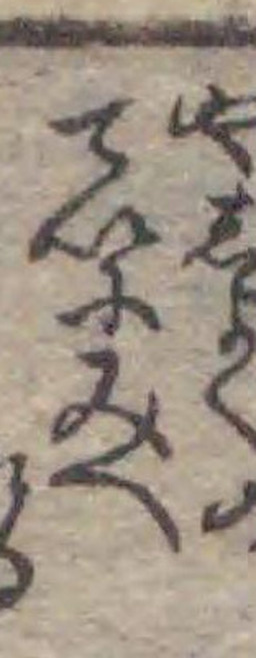ていにみへ
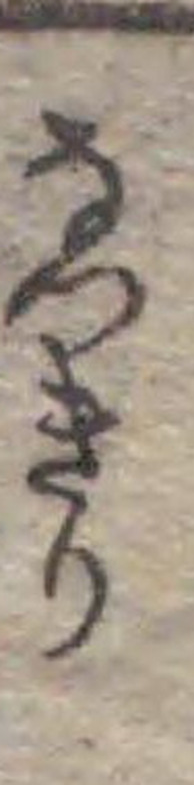なつきり
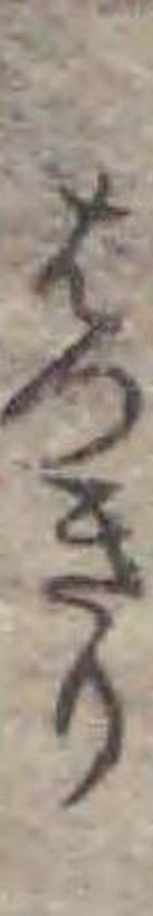はつきり
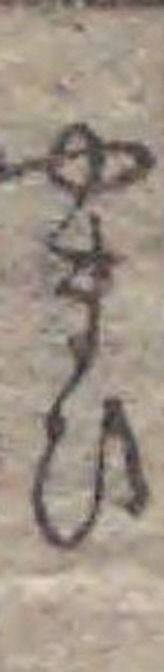やまひ
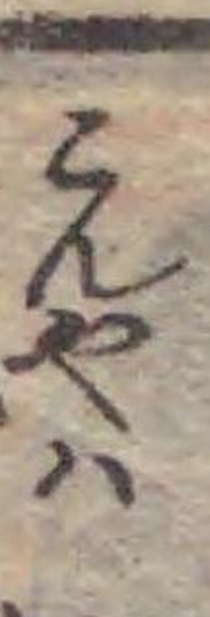こんやは
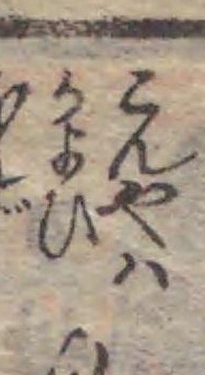こんやは
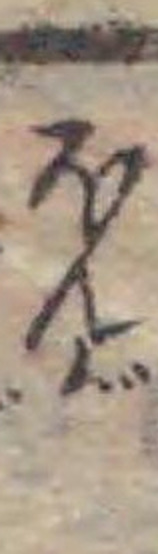ほんが
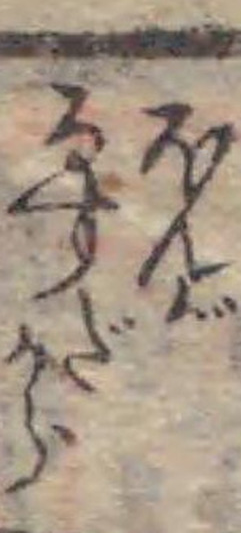るすだから
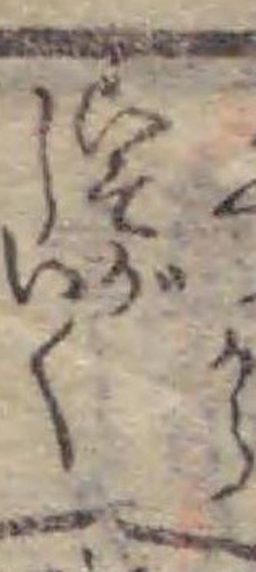しい〳〵
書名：歌の化物一寺再興 : 2巻
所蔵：国立国会図書館 National Diet Library, JAPAN
